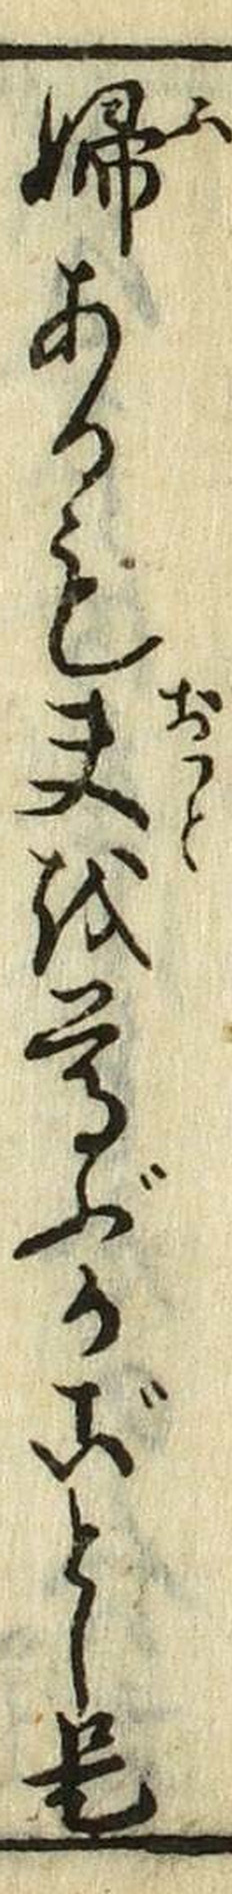婦あるも夫を尊ぶかごとし是
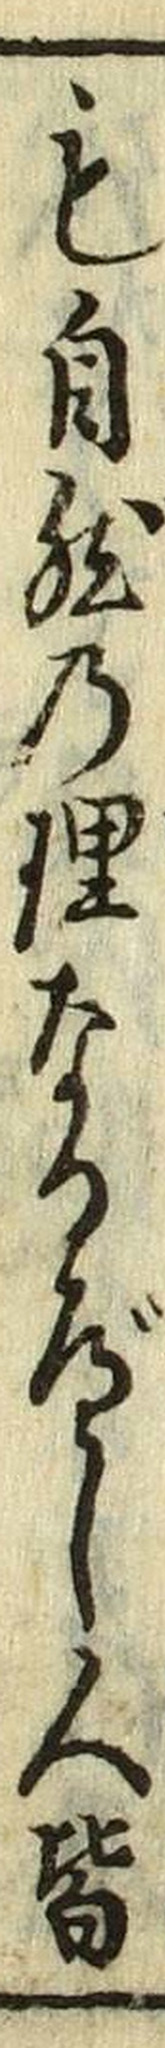も自然の理なるべし人皆
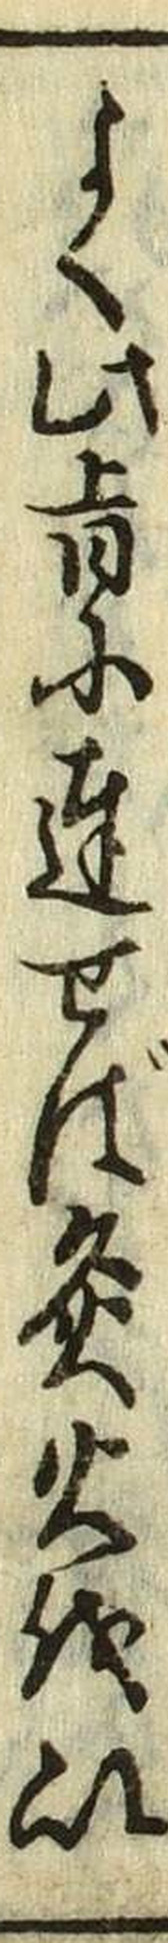よく此旨に達せば灸火を以
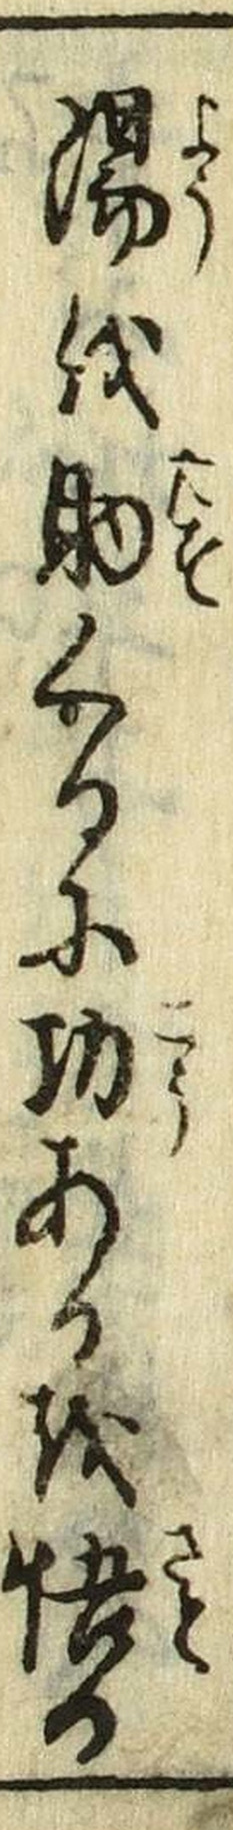陽を助くるに功あるを悟る
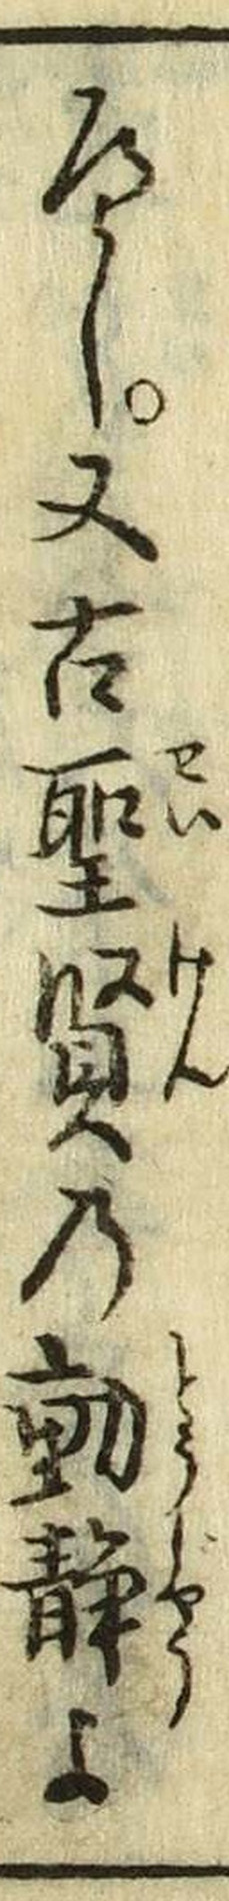へし。又古聖賢の動静よ
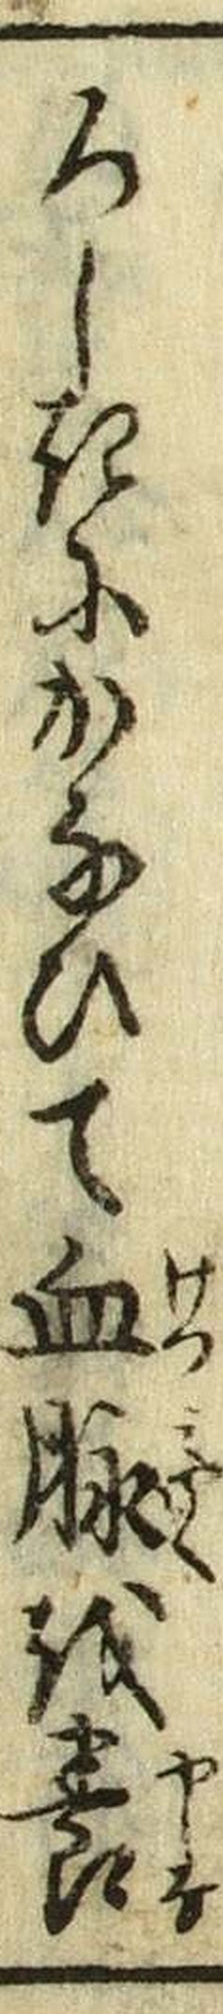ろしきにかなひて血脈を養

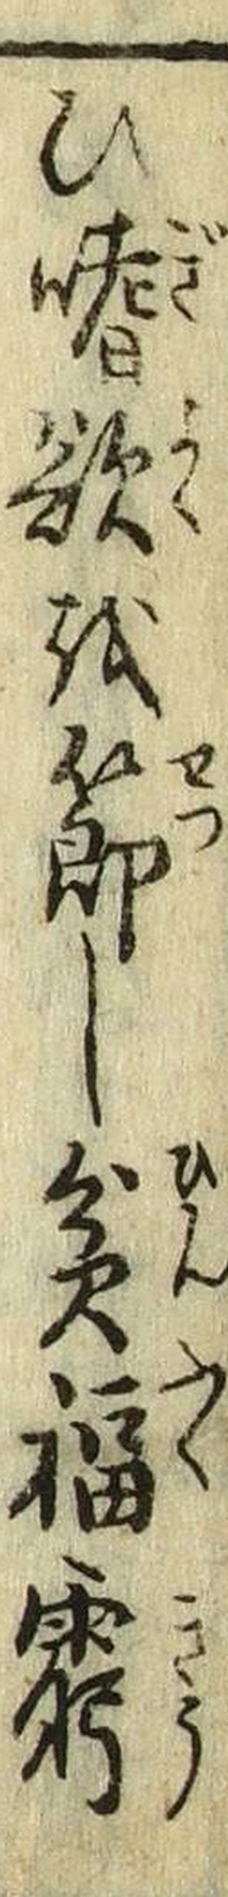ひ嗜欲を節し貧福窮
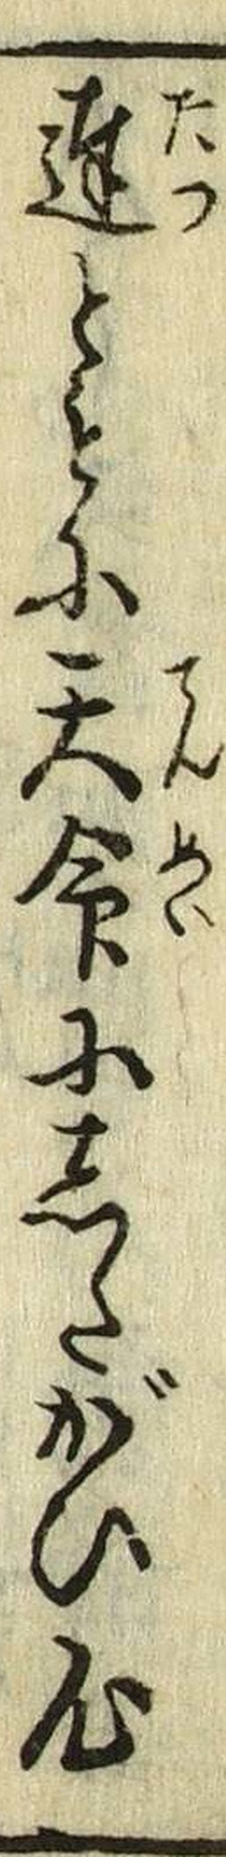達ともに天命にしたがひ心
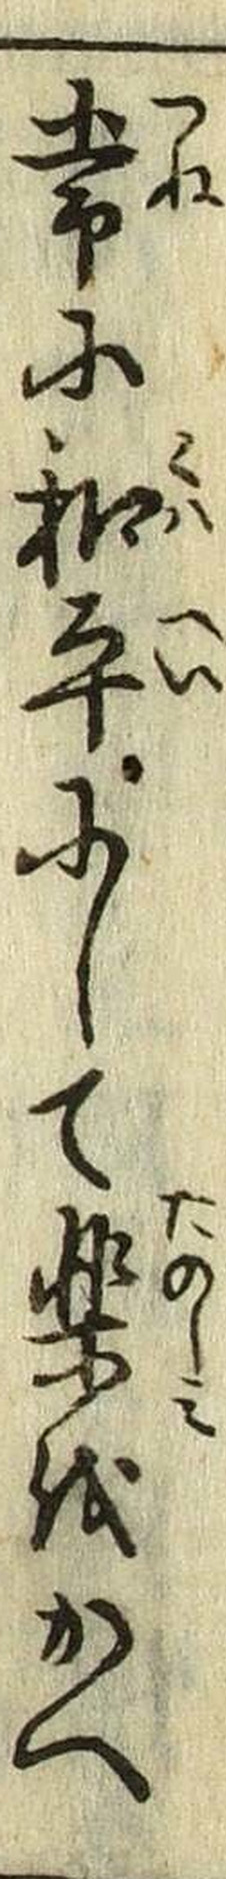常に和平にして楽をかへ
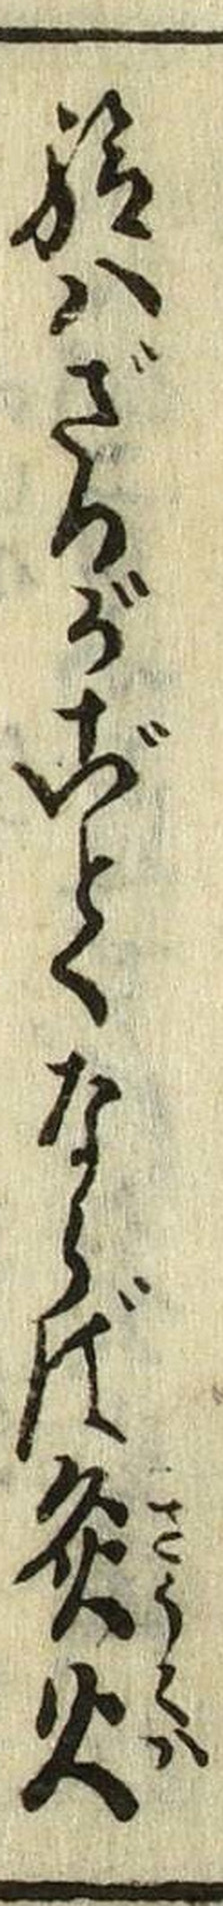給はざるがごとくならば灸火
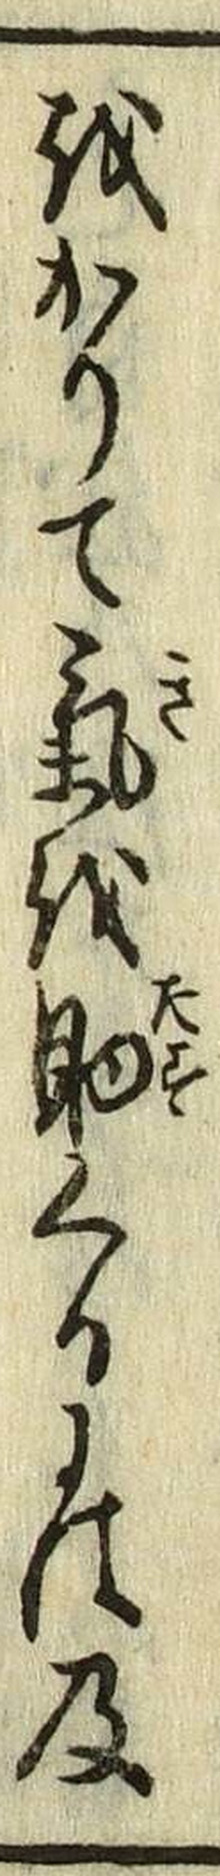をかりて気を助くるには及
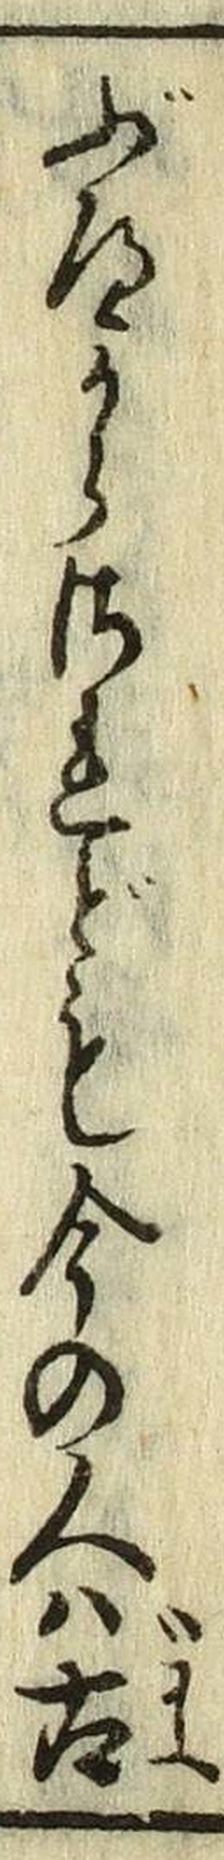ぶへからされども今の人は古
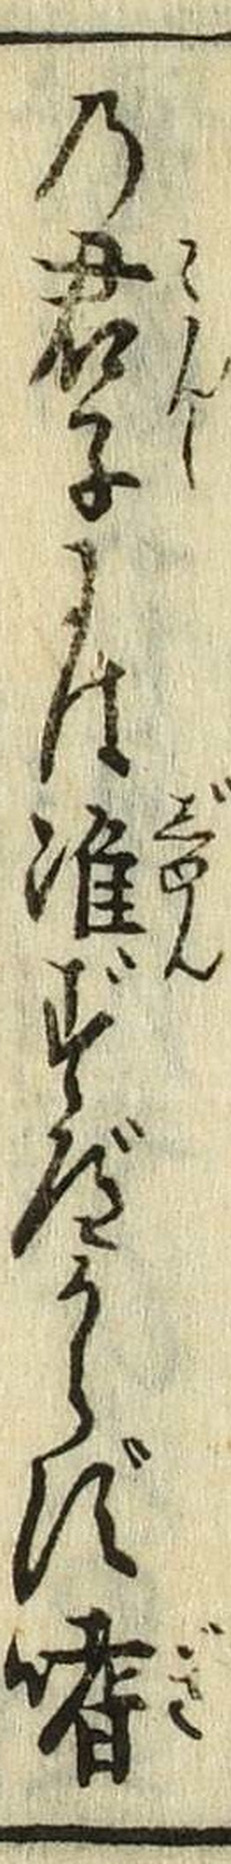の君子には准ずべからず嗜
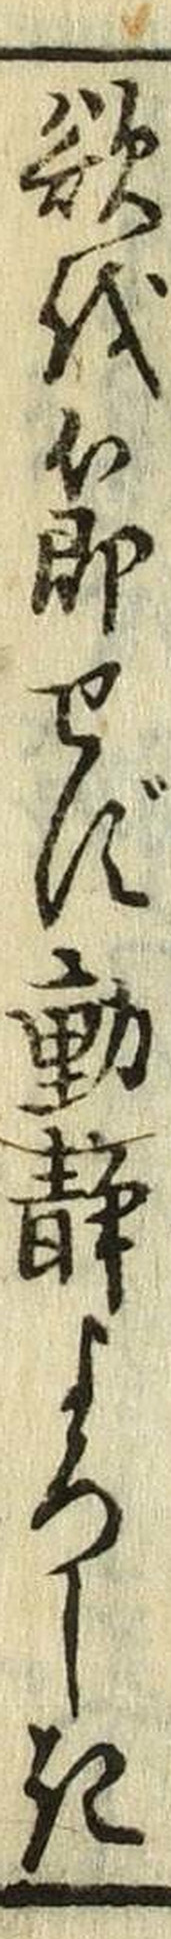欲を節せず動静よろしき
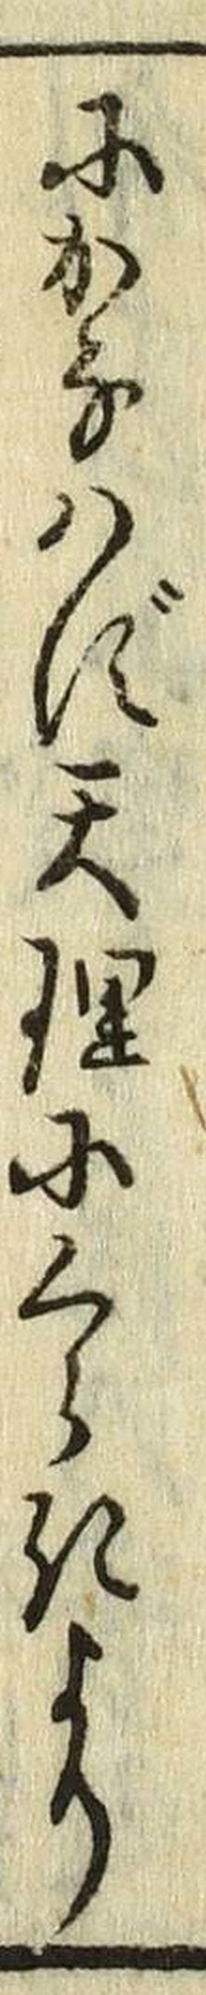にかなはず天理にくらきより
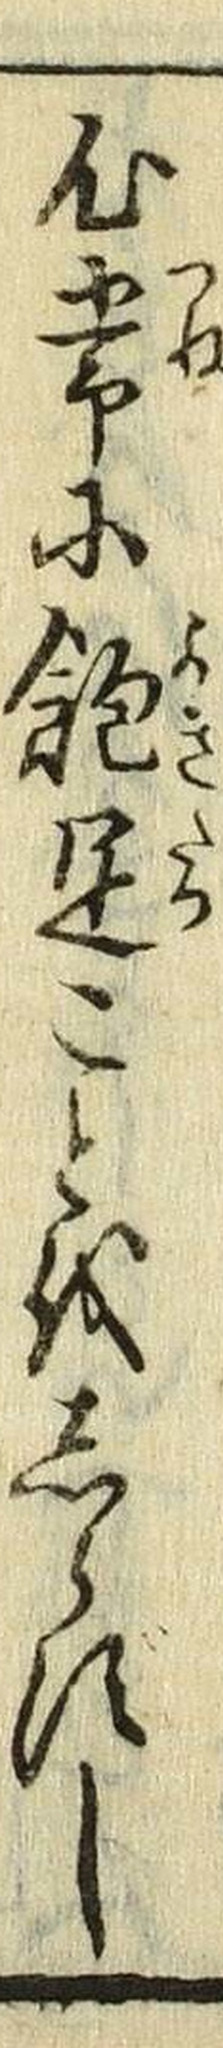心常に飽足ことをしらずし
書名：居家養生記
